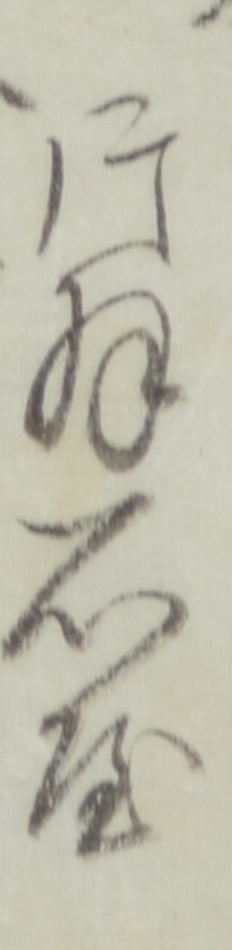片羽石屋
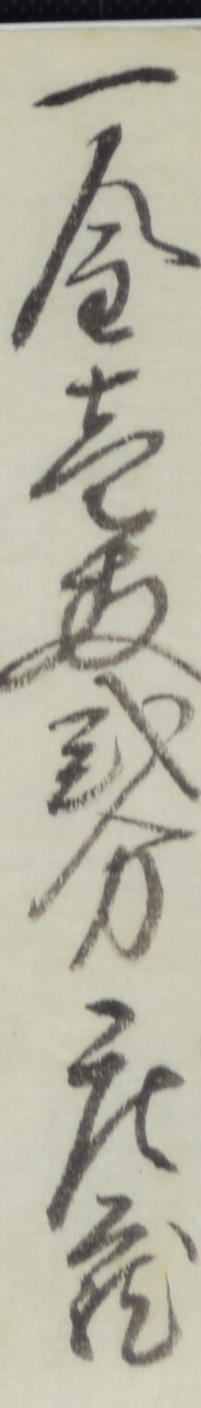一金壱両弐分庄蔵
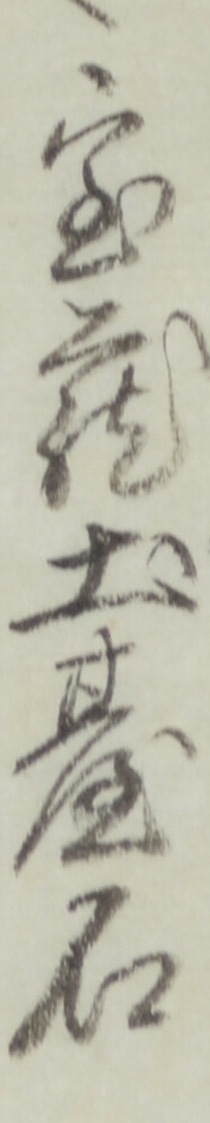宝蔵土台石
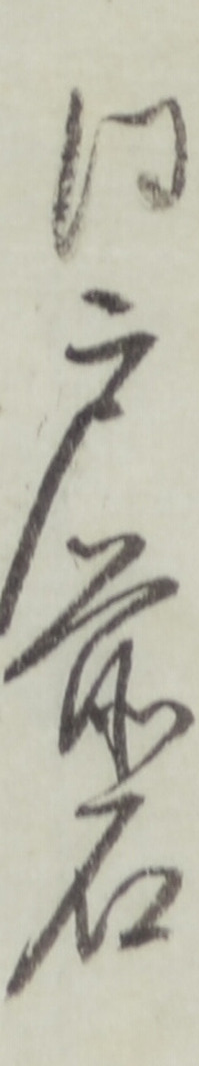同戸前石
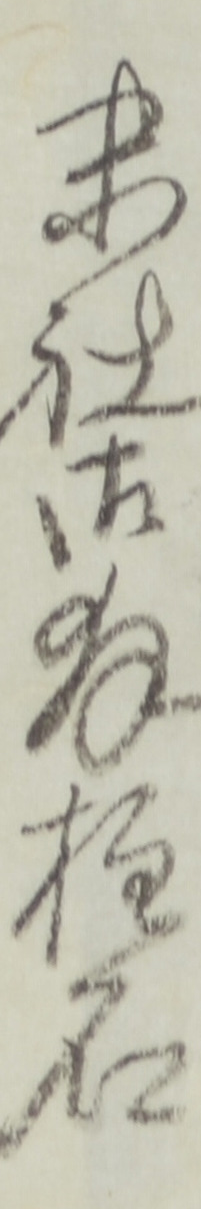末社御拝柱石
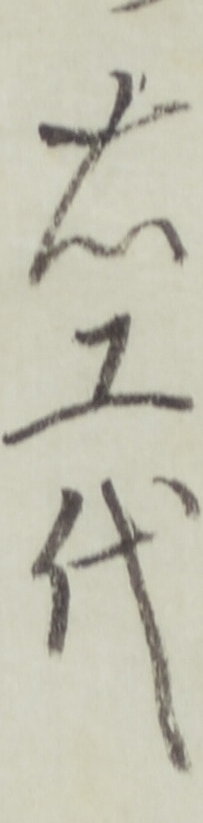右工代
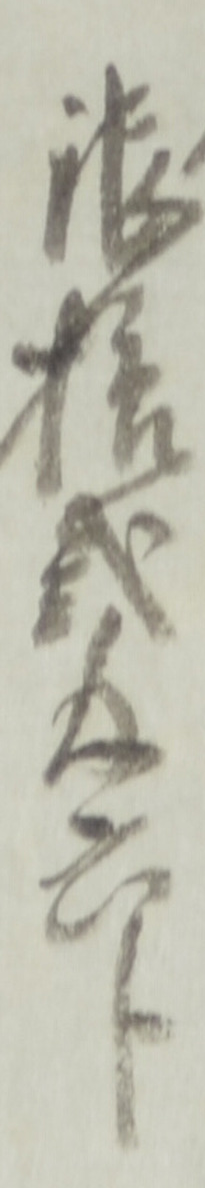銀拾弐匁六分
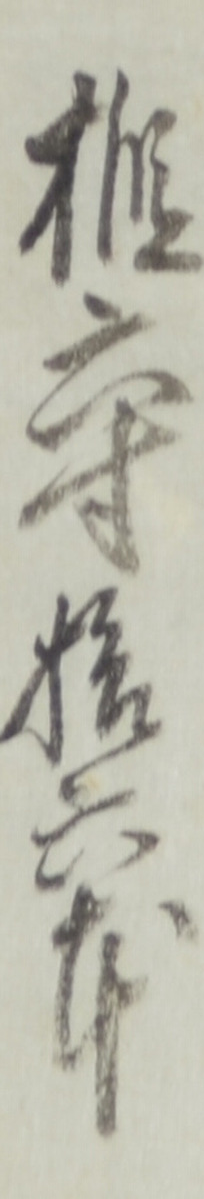樅六寸拾六本
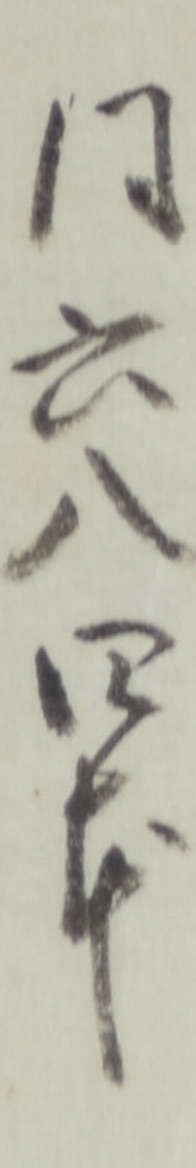同六八四本
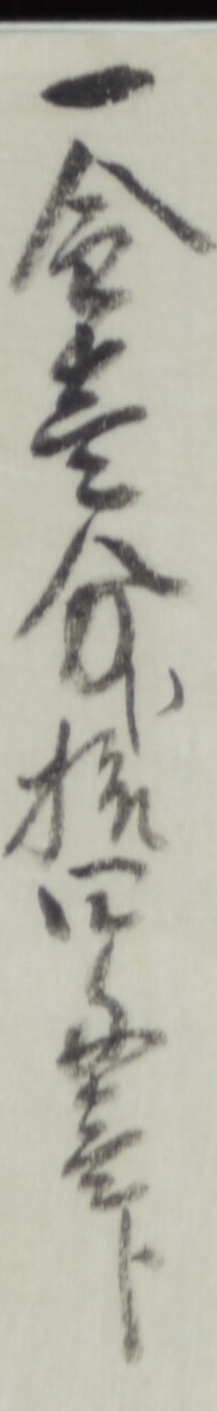一金壱分ト拾四匁壱分
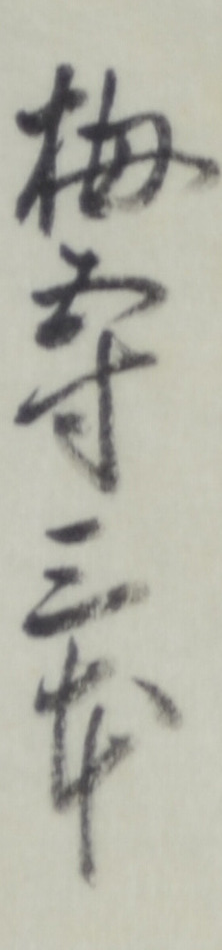栂五寸三本
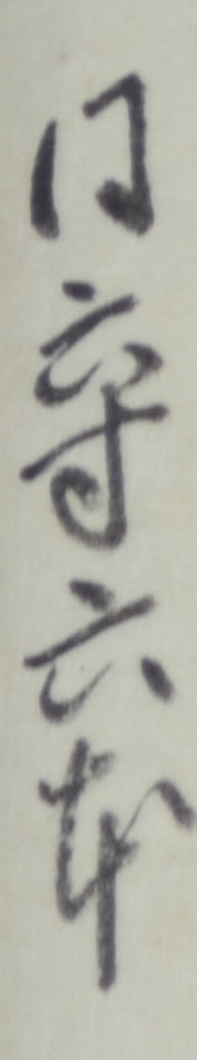同六寸六本

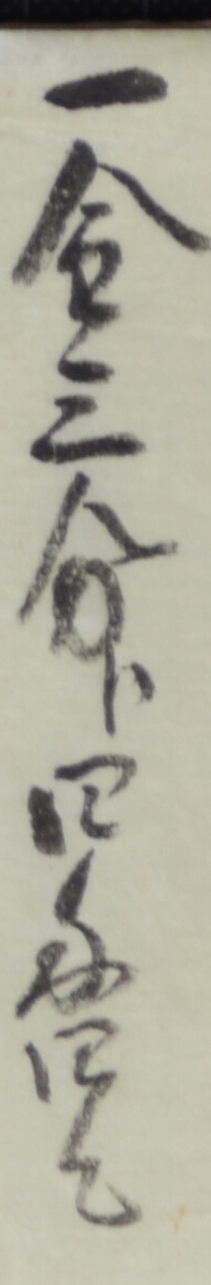一金三分ㇳ四匁四厘
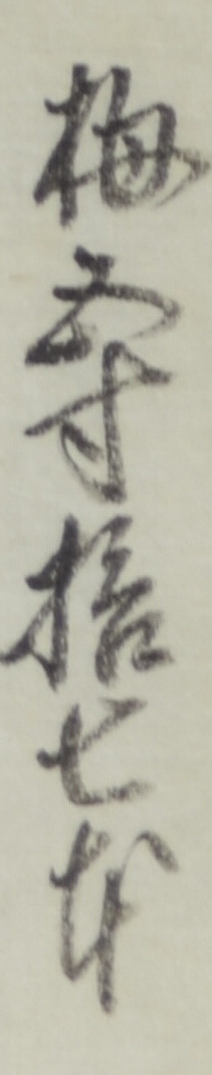栂五寸拾七本
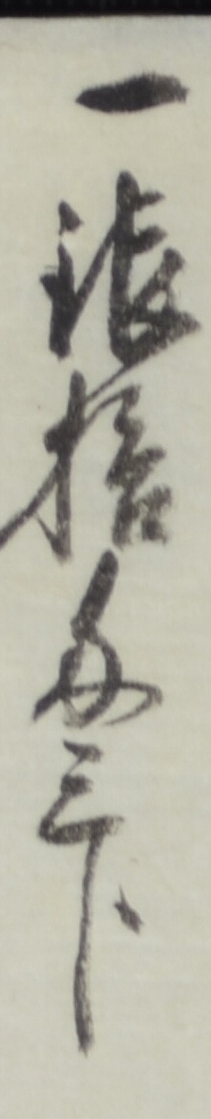一銀拾匁三分
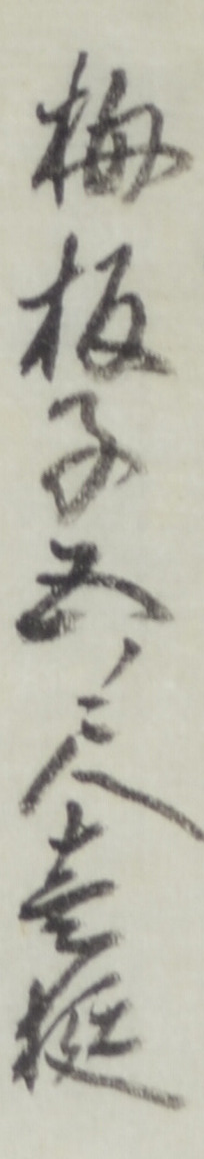梅板子五ノ尺壱挺
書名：権現分拂方
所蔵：伊那市立高遠町図書館・合同会社AMANE
